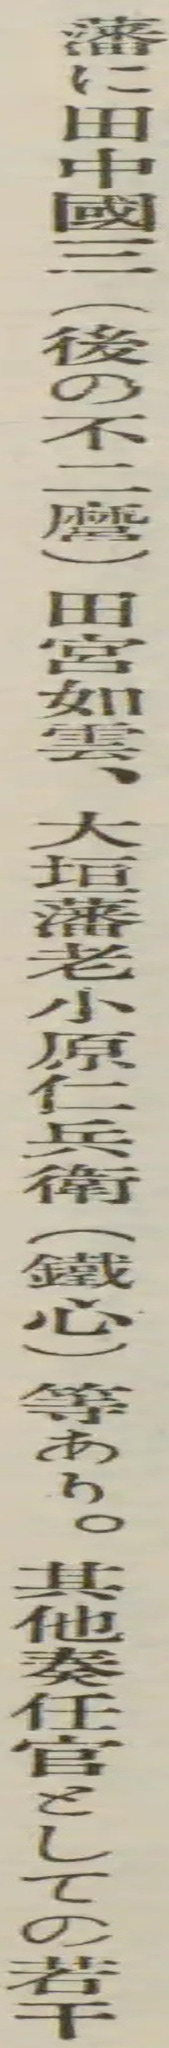藩に田中國三(後の不二麿)田宮如雲、大垣藩老小原仁兵衛(鐵心)等あり。其他奏任官としての若干
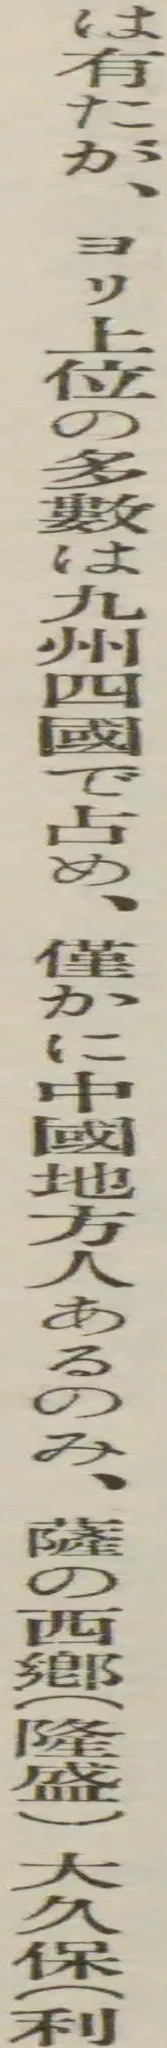は有たが、ヨリ上位の多数は九州四国で占め、僅かに中国地方人あるのみ、薩の西郷(隆盛)大久保(利
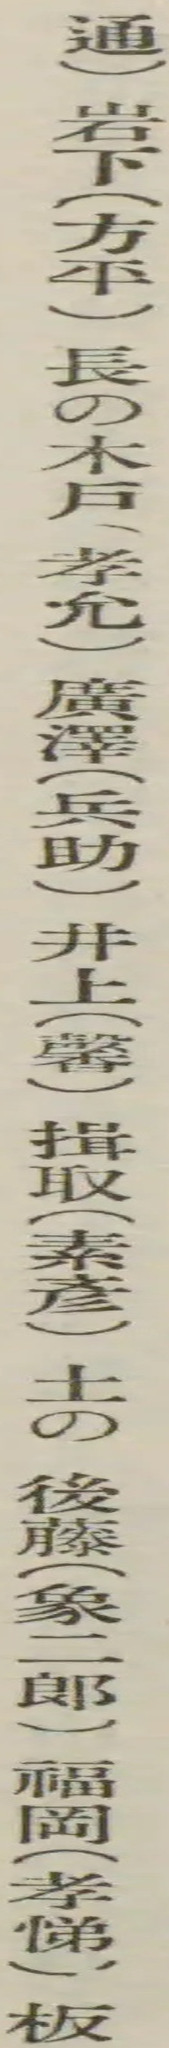通)岩下(方平)長の木戸(孝允)廣澤(兵助)井上(馨)揖取(素彦)土の後藤(象二郎)福岡(孝悌)板
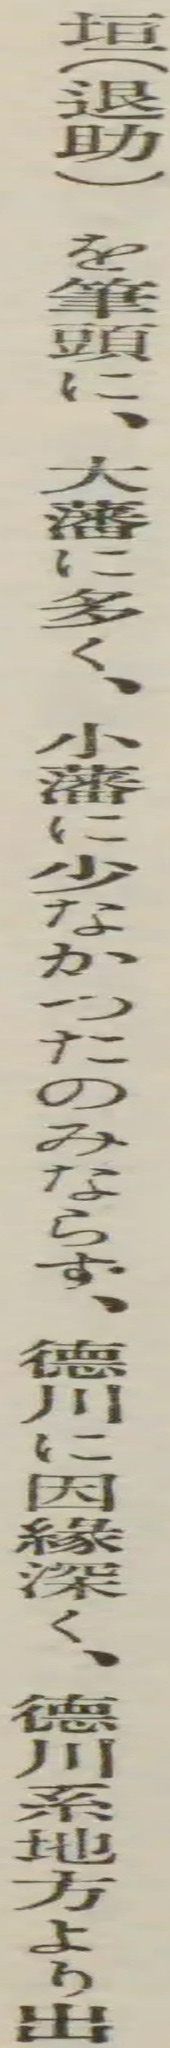垣(退助)を筆頭に、大藩に多く、小藩に少なかつたのみならず、徳川に因縁深く、徳川系地方より出
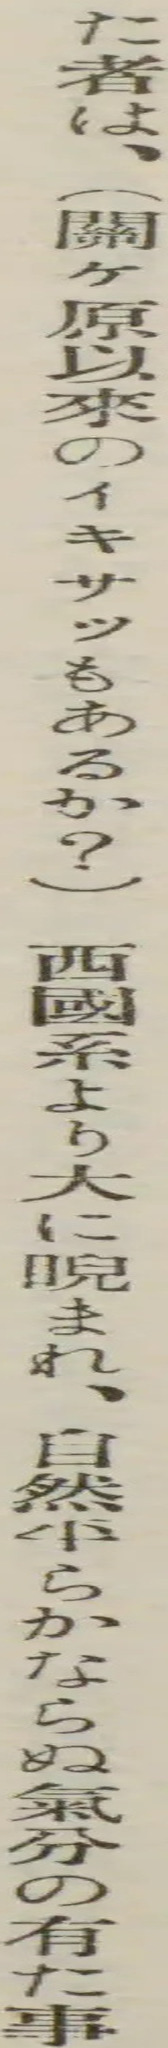た者は、(関ヶ原以来のイキサツもあるか？)西国系より大に睨まれ、自然平らかならぬ気分の有た事
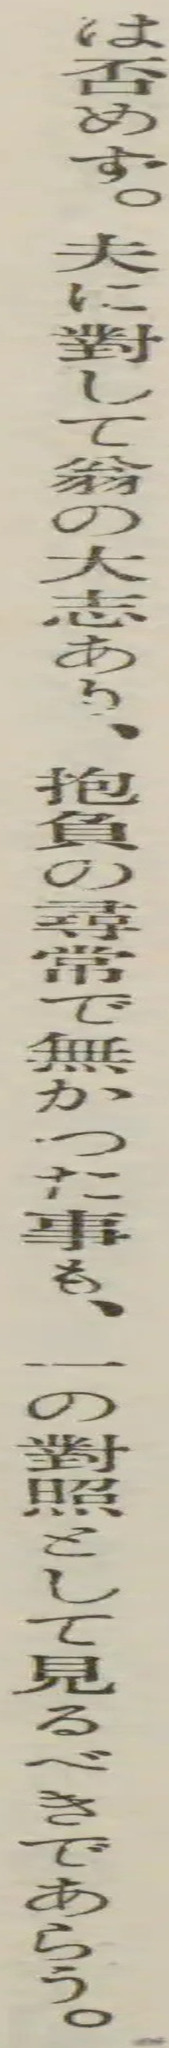は否めず。夫に対して翁の大志あり、抱負の尋常で無かつた事も、一の対照として見るべきであらう。
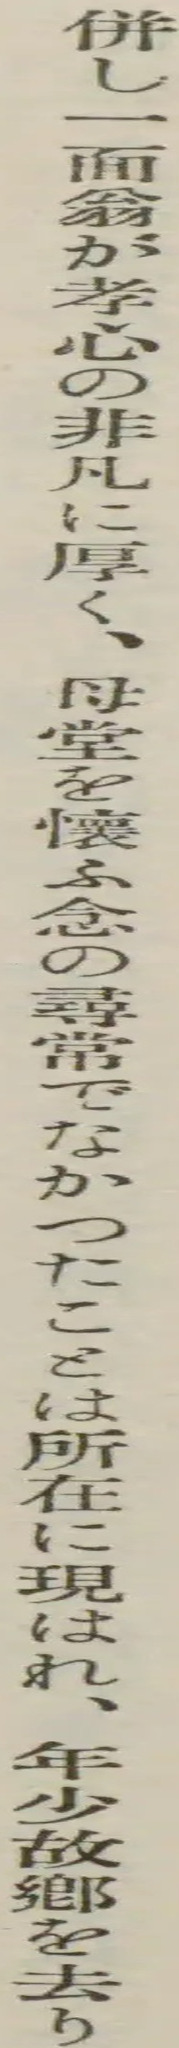併し一面翁が孝心の非凡に厚く、母堂を懐ふ念の尋常でなかつたことは所在に現はれ、年少故郷を去り
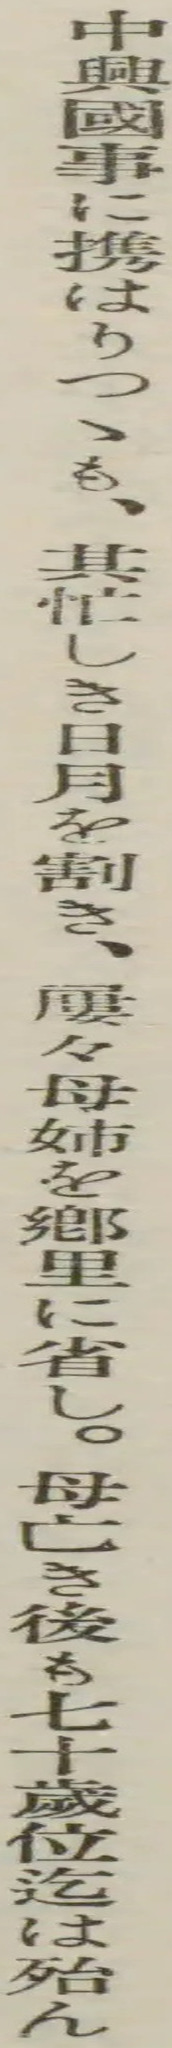中興国事に携はりつゝも、其忙しき日月を割き、屡々母姉を郷里に省し。母亡き後も七十歳位迄は殆ん
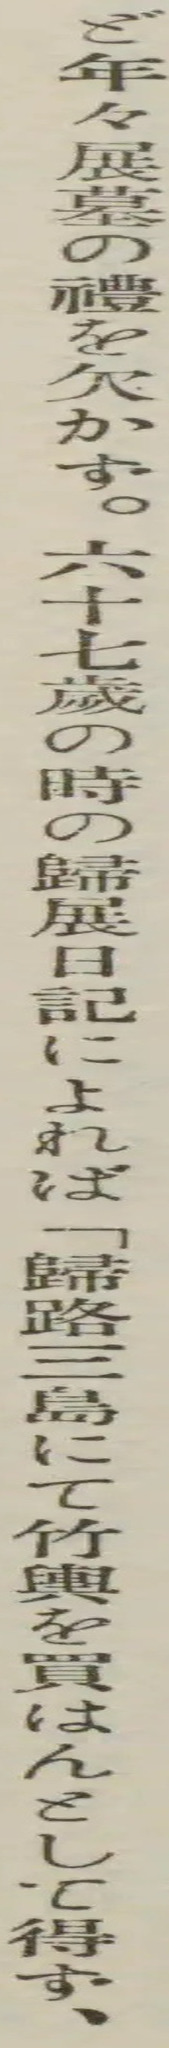ど年々展墓の礼を欠かず。六十七歳の時の帰展日記によれば「帰路三島にて竹輿を買はんとして得ず、
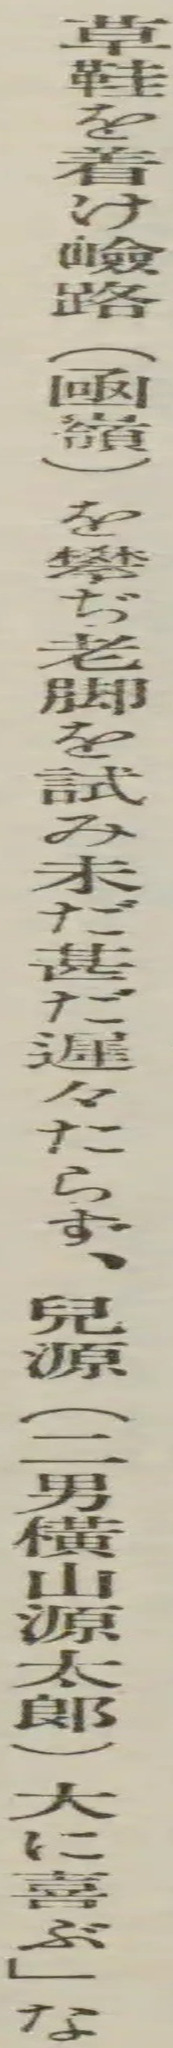草鞋を着け嶮路(函嶺)を攀ぢ老脚を試み未だ甚だ遅々たらず、兒源(二男横山源太郎)大に喜ぶ」な
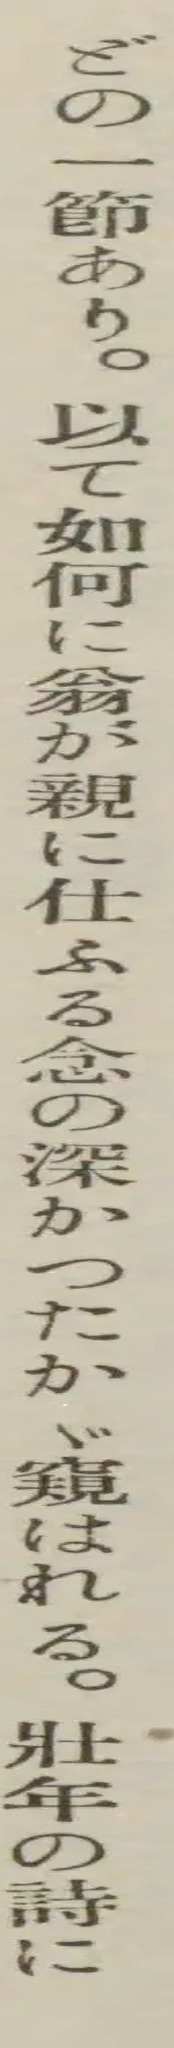どの一節あり。以て如何に翁が親に仕ふる念の深かつたかゞ窺はれる。壮年の詩に
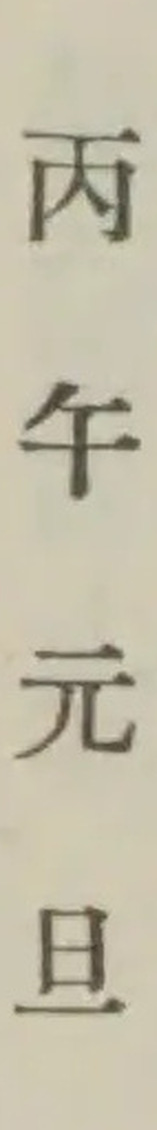丙午元旦
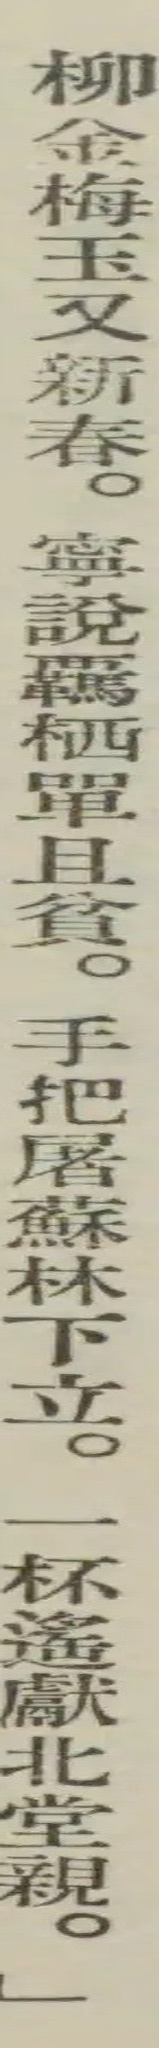柳金梅玉又新春。寧説覊栖單且貧。手把屠蘇林下立。一杯遥獻北堂親。」
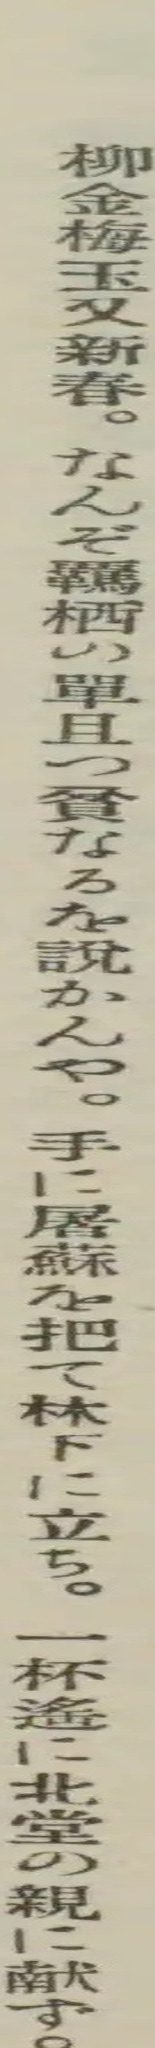柳金梅玉又新春。なんぞ覊栖の単且つ貧なるを説かんや。手に屠蘇を把て林下に立ち。一杯遥に北堂の親に献ず。
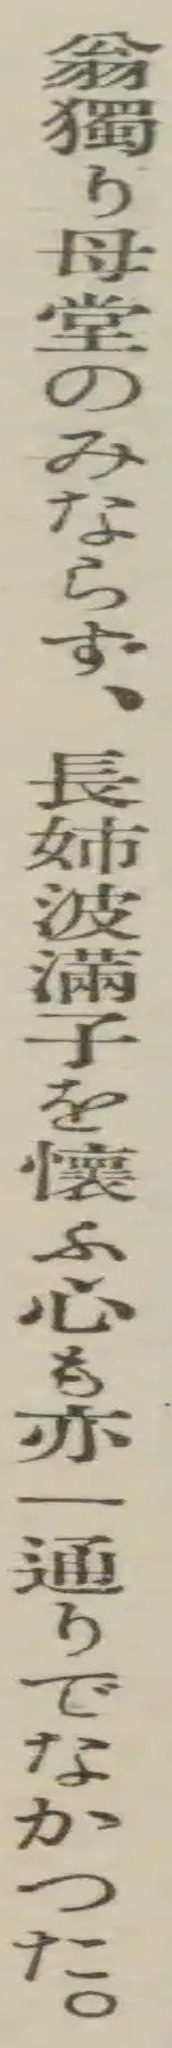翁獨り母堂のみならず、長姉波満子を懐ふ心も亦一通りでなかつた。
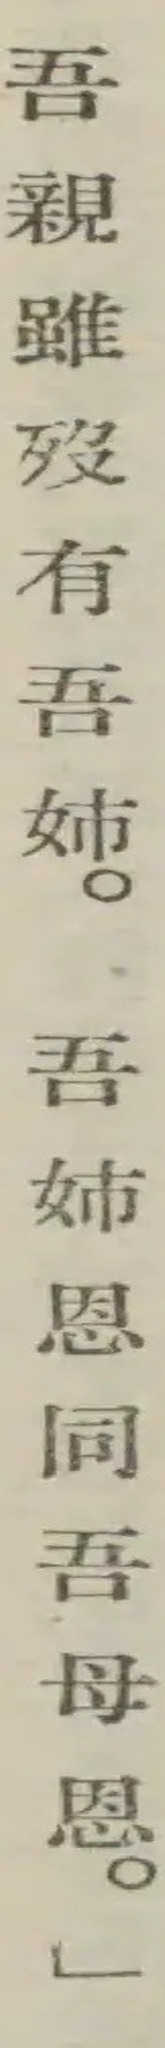吾親雖歿有吾姉。吾姉恩同吾母恩。」
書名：小野湖山翁小伝
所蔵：国立国会図書館 National Diet Library, JAPAN
